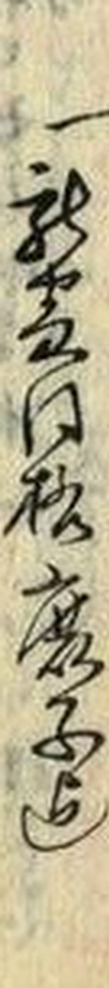新番同格庶子迄
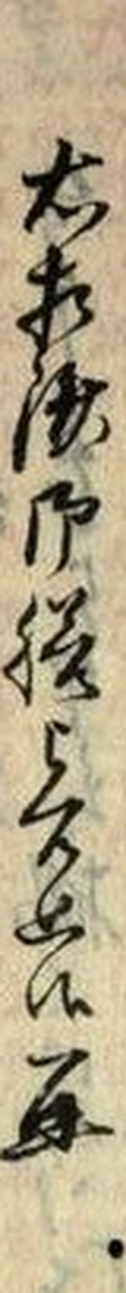右相済御膳被召上候再
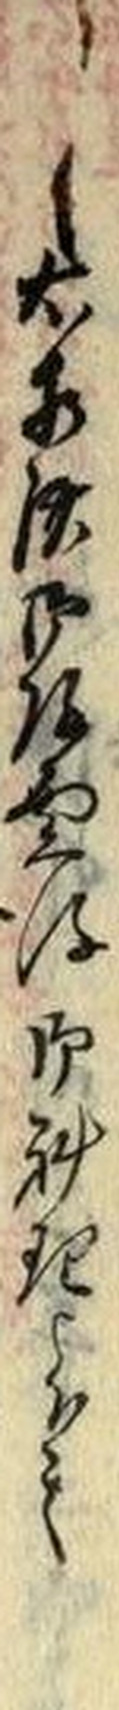右相済御帰殿後御料理被下之
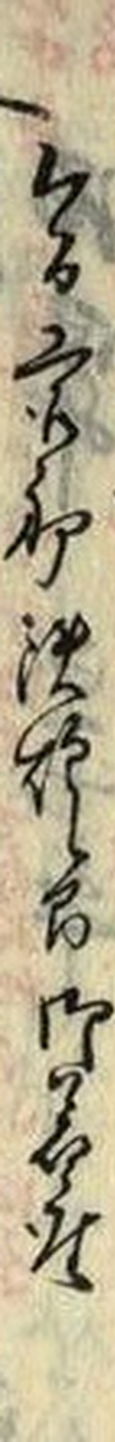今日最初鉄炮之間御着座
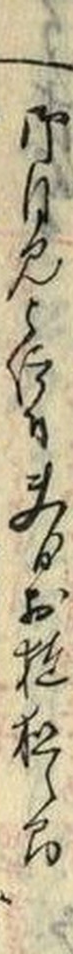御目見被仰付夫ゟ於韃靼之間
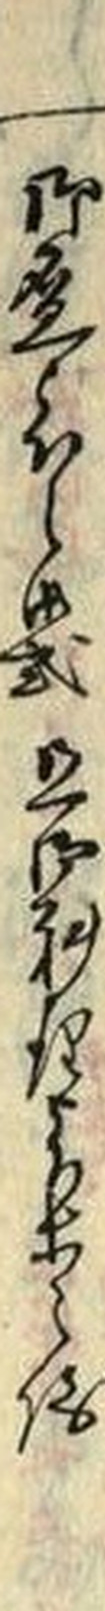御盃被下之御式且御料理被下等之儀
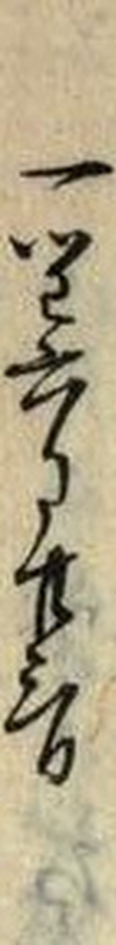一閏六月廿三日

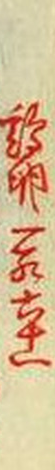鶏卵一箱六十一
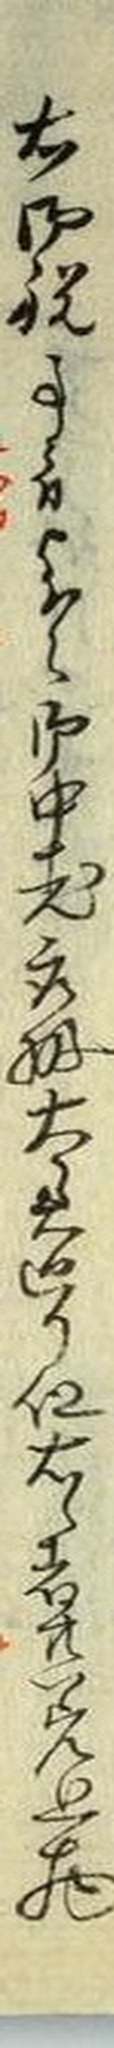右御祝事ニ付被下之御中老取扱大奥廻り但右之者共差上物
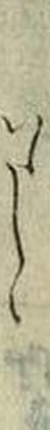いたし候
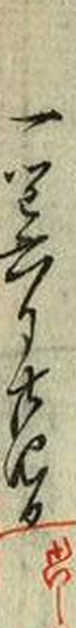一閏六月廿四日
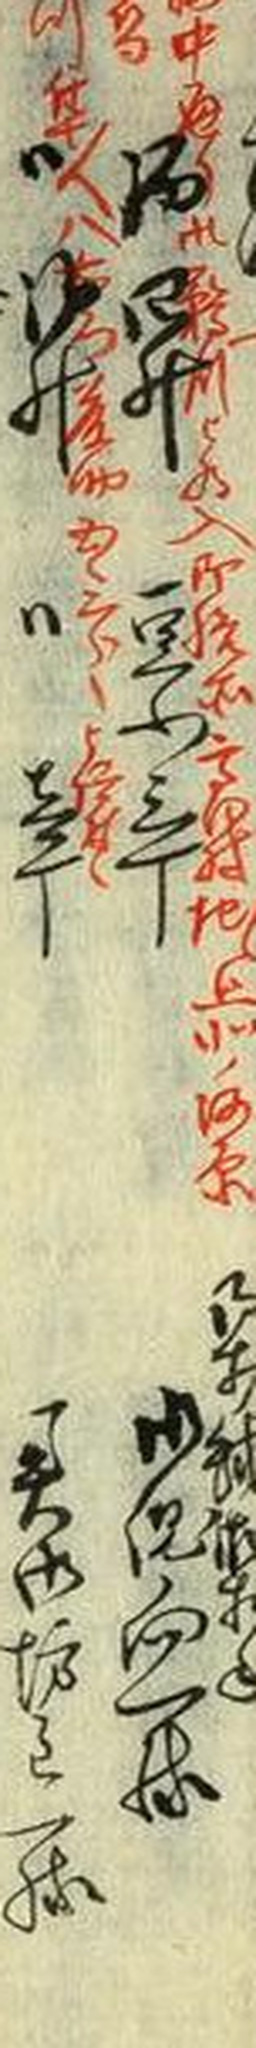同弐升同壱丁奥御坊主一統
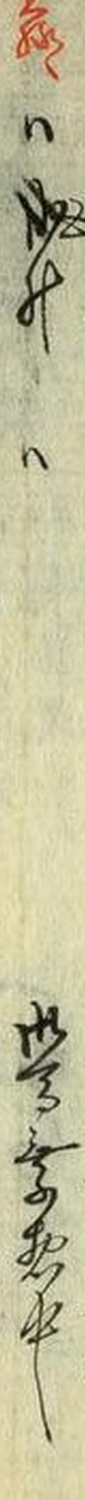同五升同御馬乗惣中
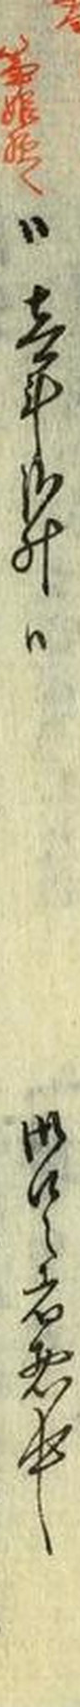同壱斗弐升同御口之者惣中
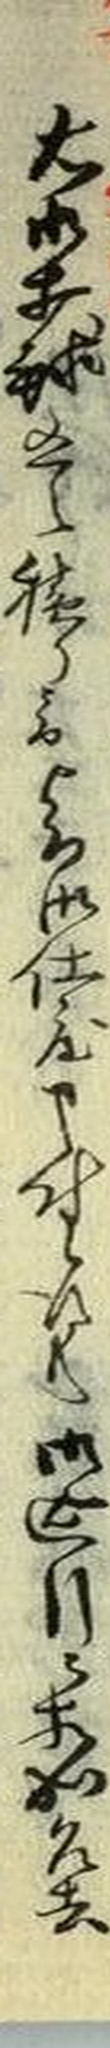右御打毬有之積りニ而被下御仕度申付候得共御延引ニ相成乍去
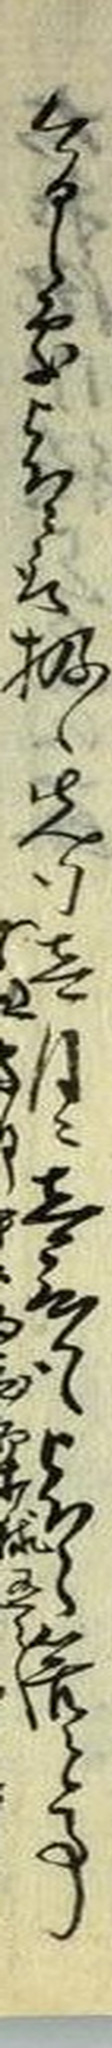今日之処被下ニ取扱候先ツ壱月ニ壱度ツヽ被下之筈ニ候事
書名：少傅日録抄（斉承付側向頭取日記、在国）
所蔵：福井県文書館 Fukui Prefectural Archives
